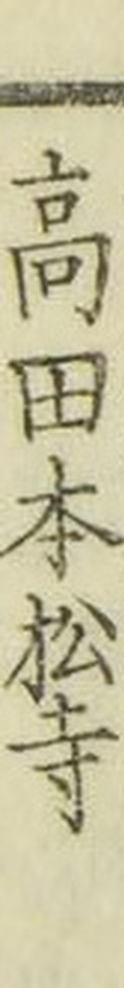髙田本松寺
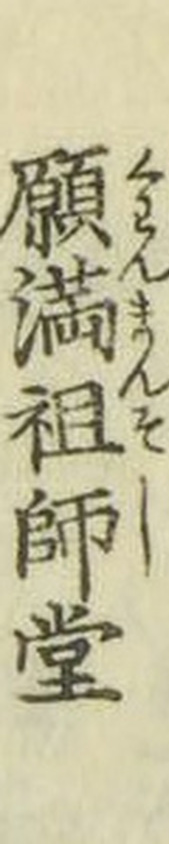願満祖師堂
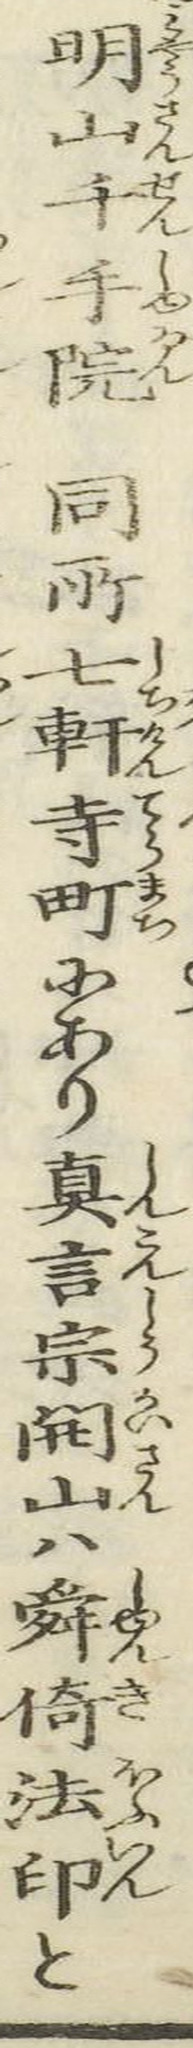三明山千手院同所七軒寺町にあり真言宗開山は舜倚法印と
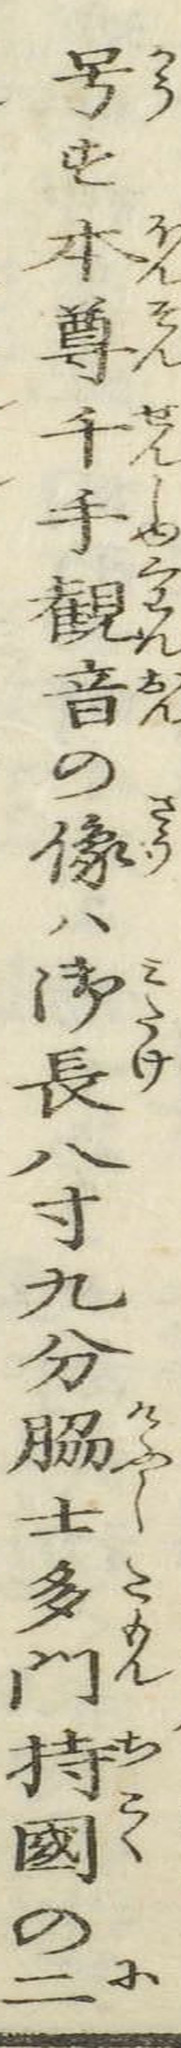号す本尊千手観音の像は御長八寸九分脇士多門持国の二
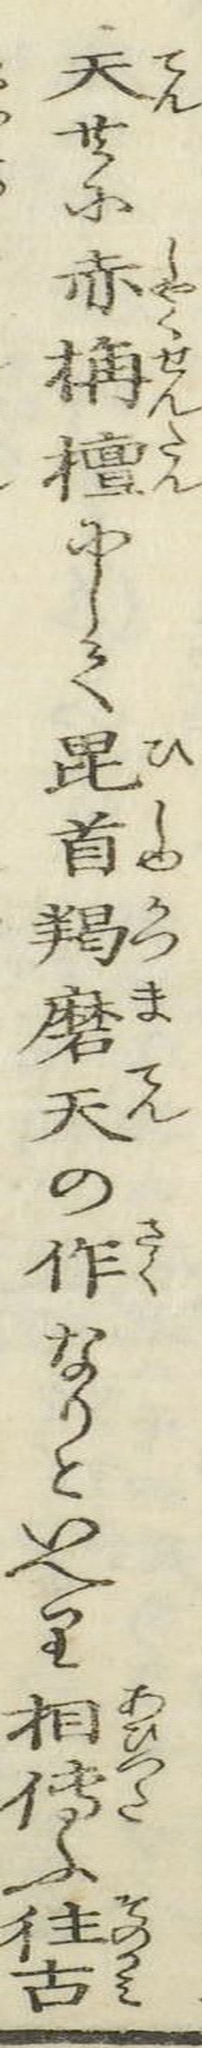天共に赤栴檀にして毘首羯磨天の作なりといへり相伝ふ往古
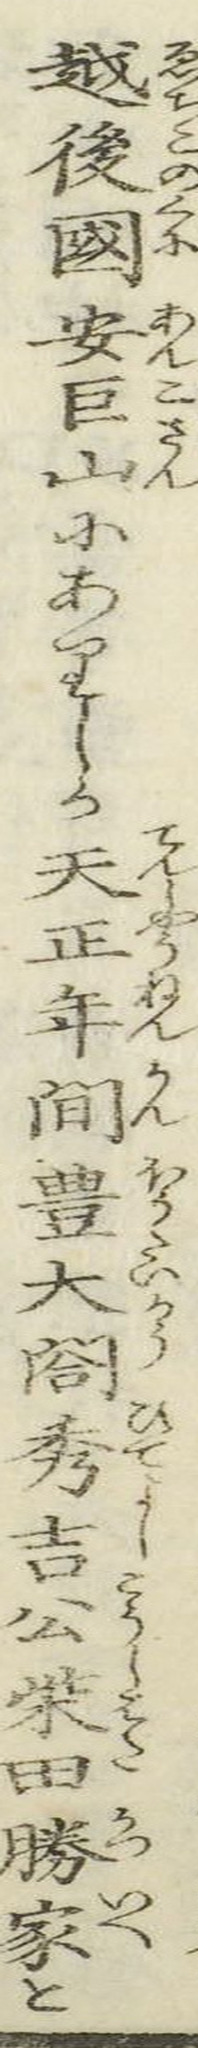越後国安巨山にありしか天正年間豊大閤秀吉公柴田勝家と
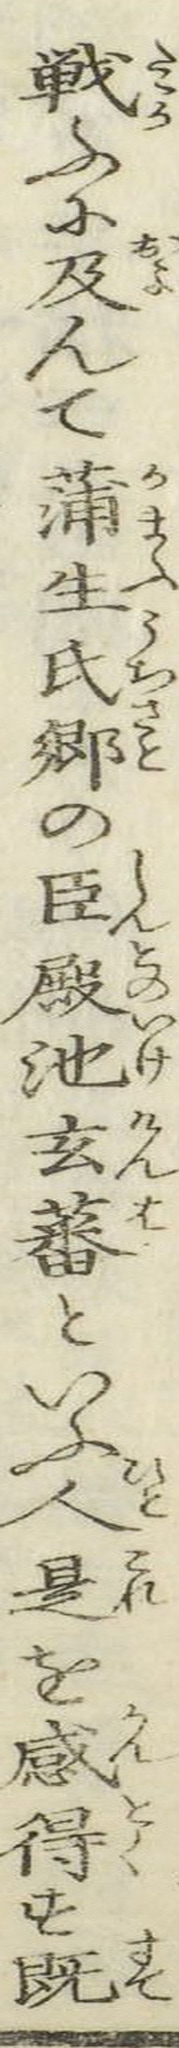戦ふに及んて蒲生氏郷の臣殿池玄蕃といふ人是を感得す既
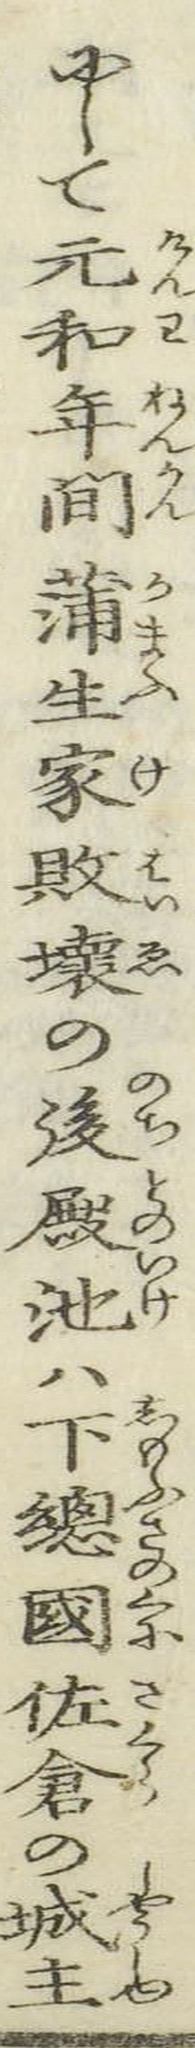にして元和年間蒲生家敗壊の後殿池は下総国佐倉の城主
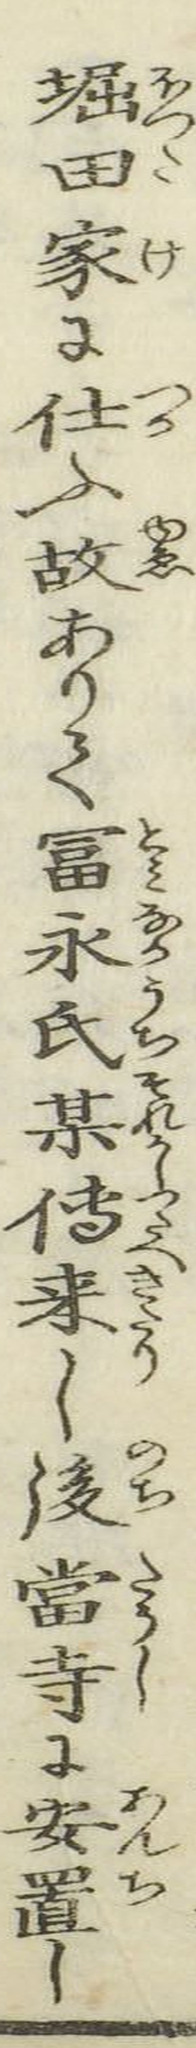堀田家に仕ふ故ありて冨永氏某伝来し後当寺に安置し
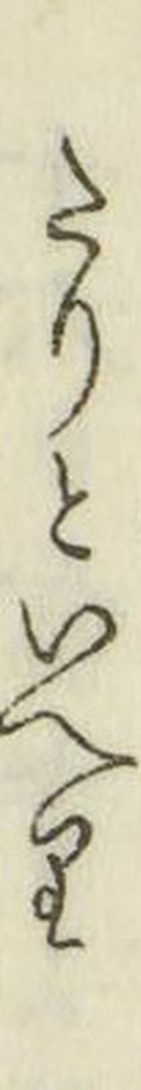たりといへり
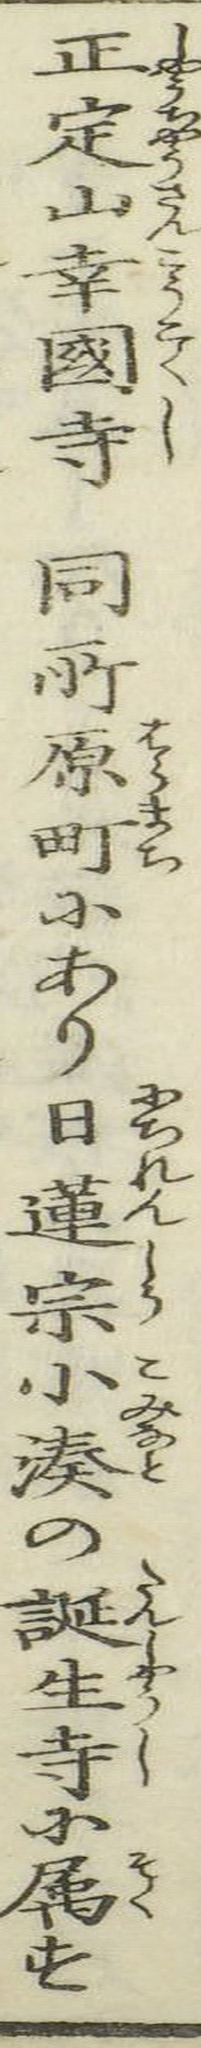正定山幸国寺同所原町にあり日蓮宗小湊の誕生寺に属す
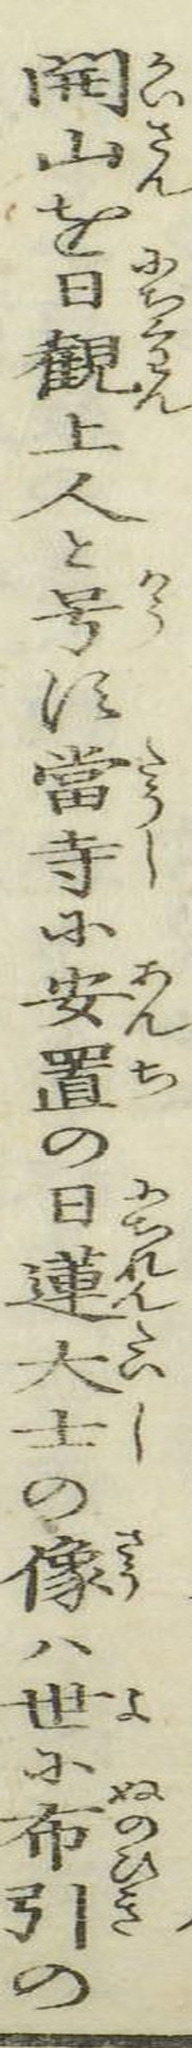開山を日観上人と号す当寺に安置の日蓮大士の像は世に布引の
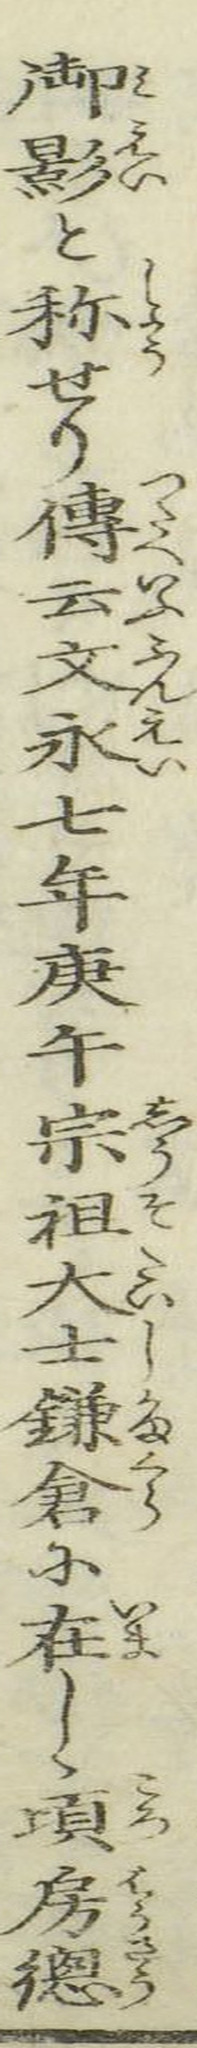御影と称せり伝云文永七年庚午宗祖大士鎌倉に在しゝ頃房総
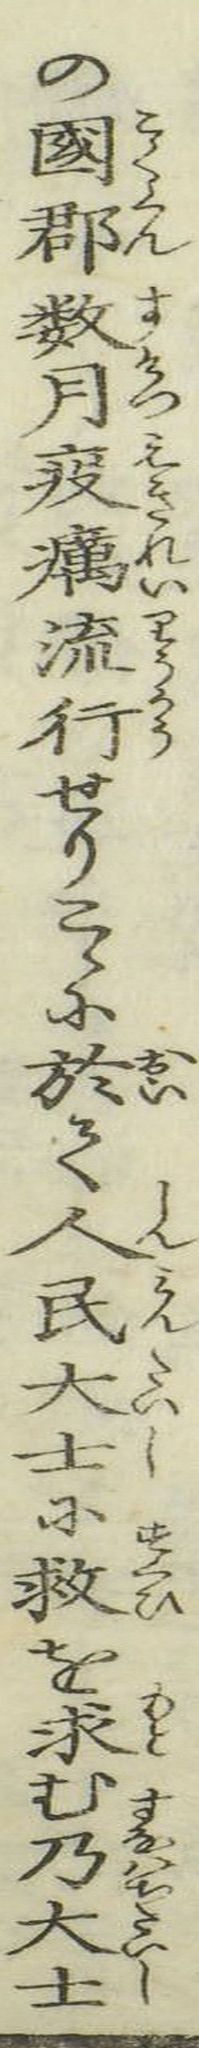の国郡数月疫癘流行せりこゝに於て人民大士に救を求む乃大士

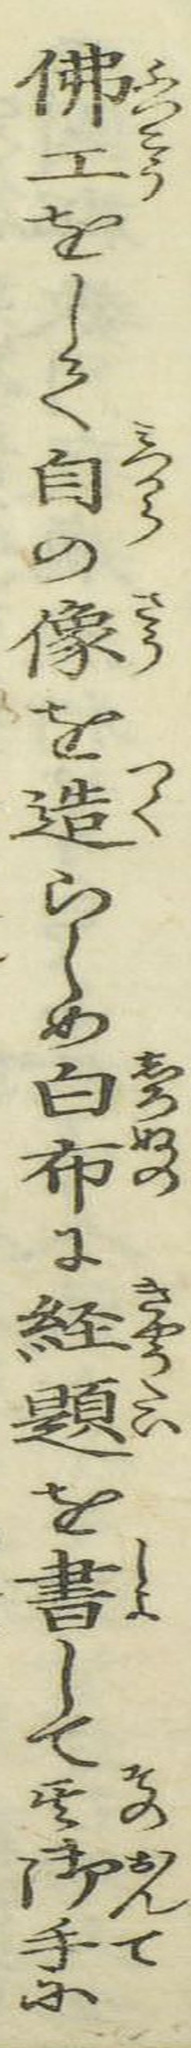仏工をして自の像を造らしめ白布に経題を書して其御手に
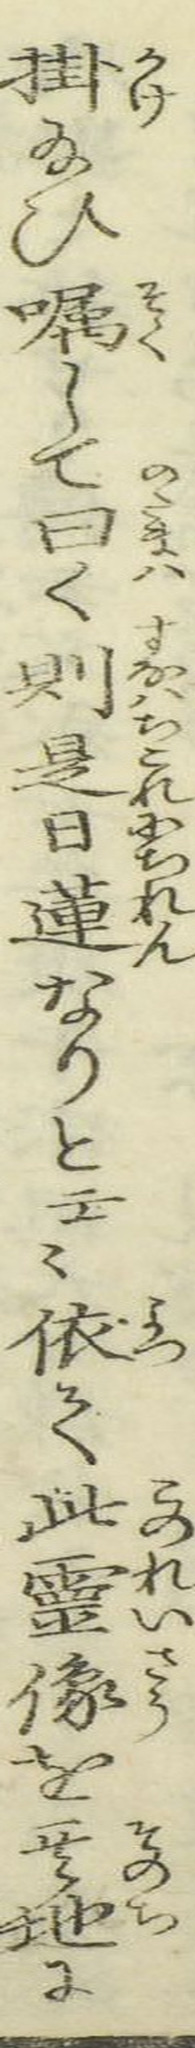掛給ひ嘱して曰く則是日蓮なりと云々依て此霊像を其地に
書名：江戸名所図会 20巻 巻之11
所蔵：東京学芸大学教育コンテンツアーカイブ
